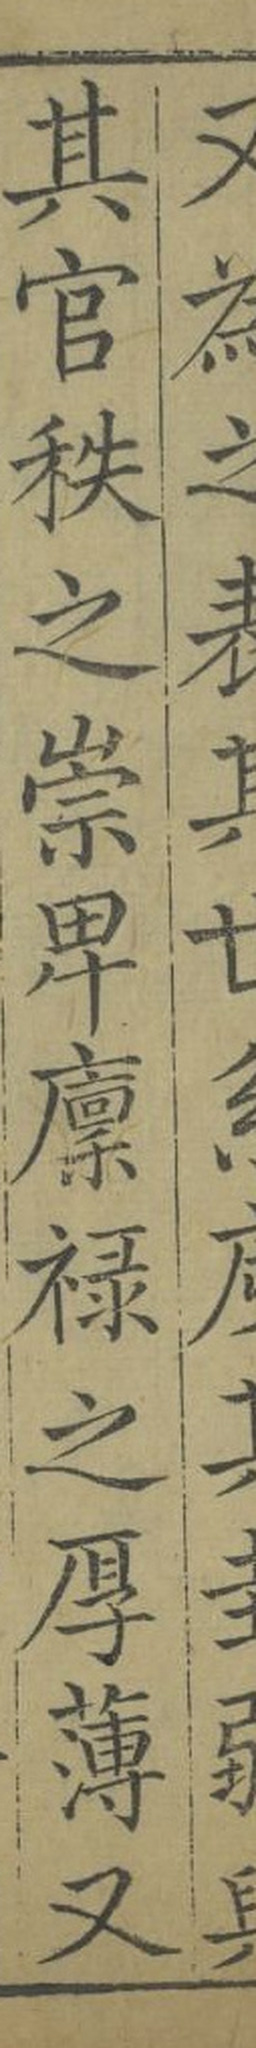其官秩之崇卑廩禄之厚薄又
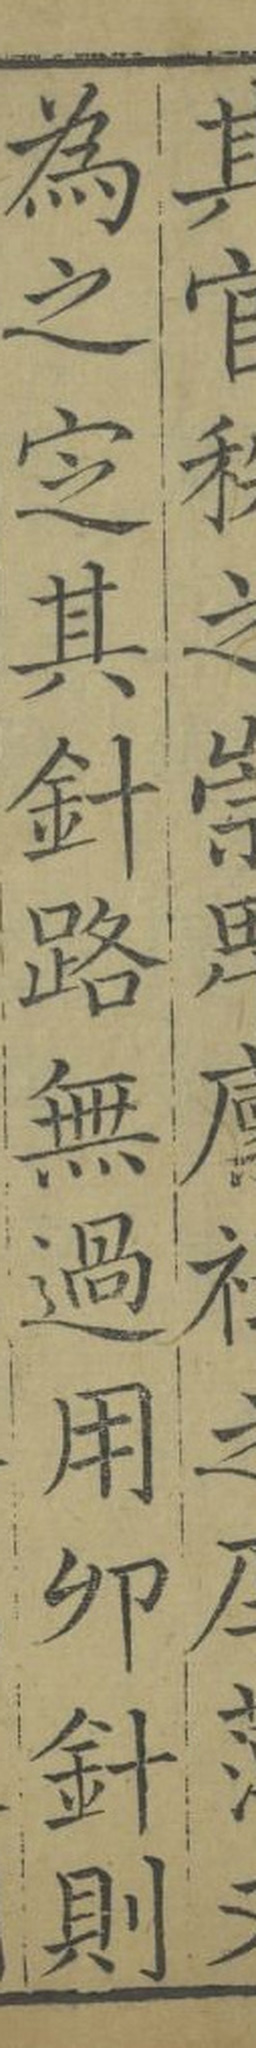為之㝎其針路無過用叩針則
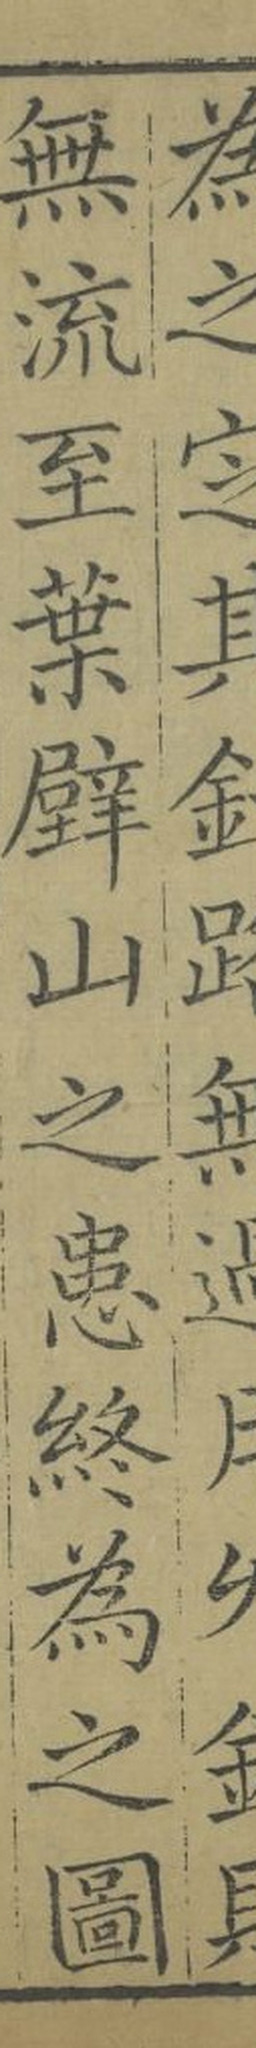無流至葉壁山之患終為之圖
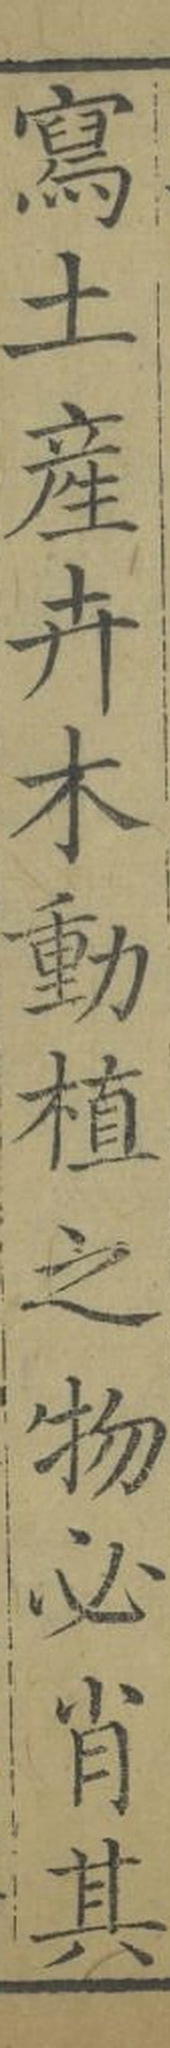寫土産卉木動植之物必肖其
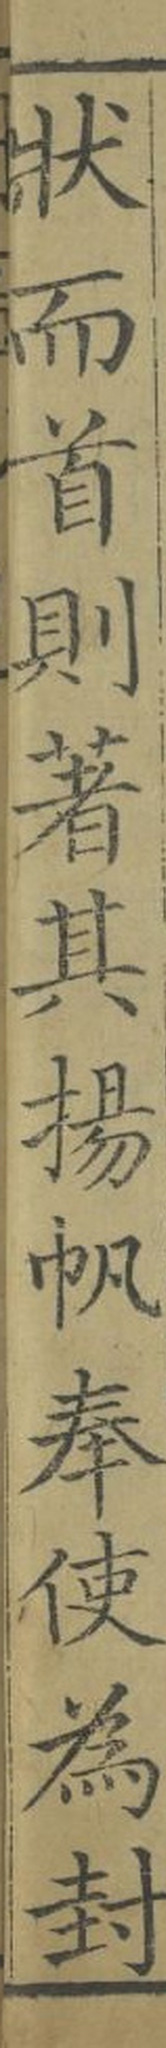狀而首則著其揚帆奉使為封
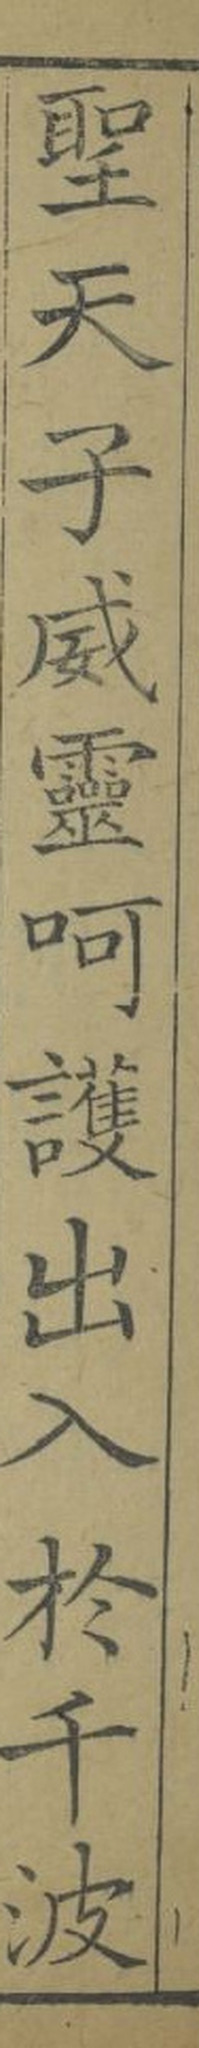聖天子威靈呵護出入扵千波
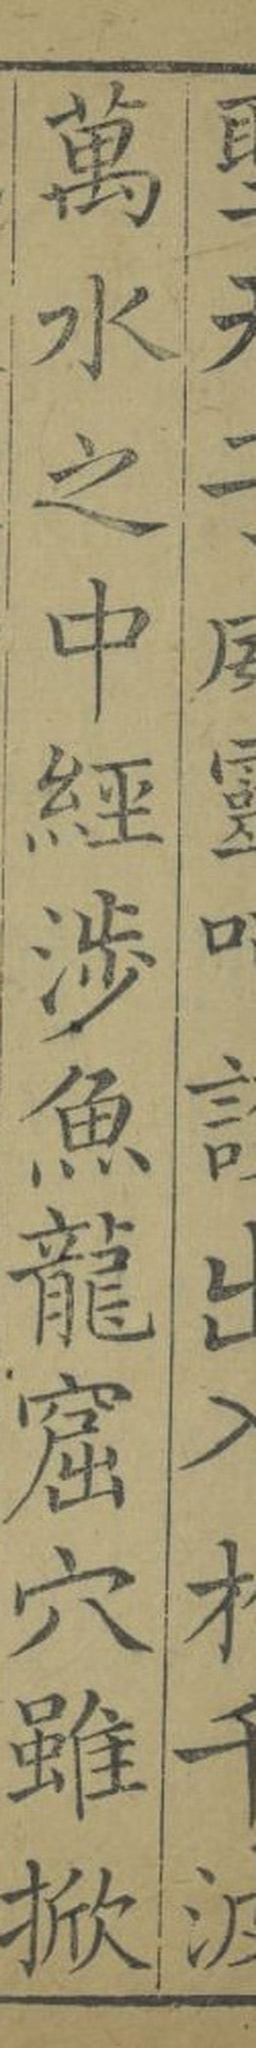萬水之中經渉魚龍窟穴雖掀
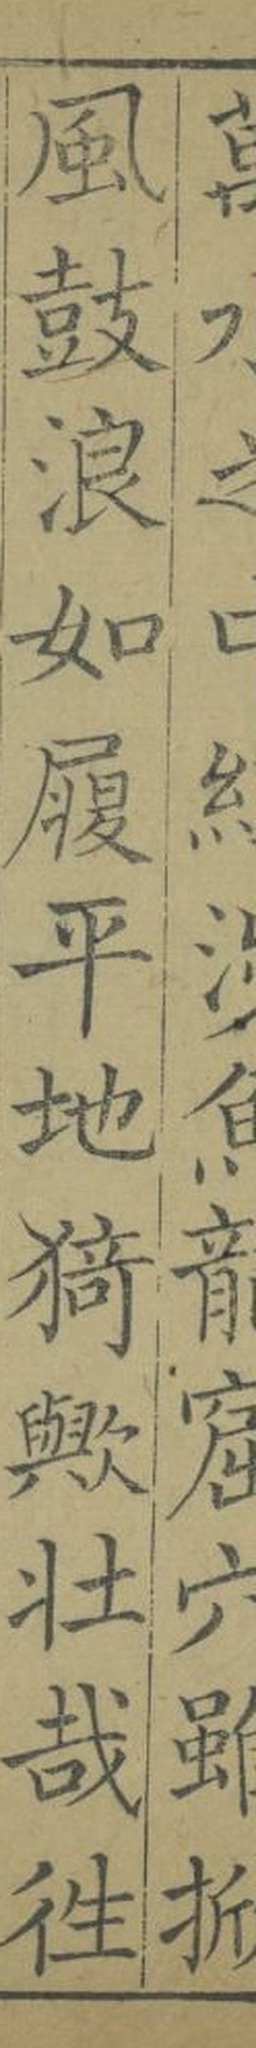風鼓浪如履平地猗歟壮哉徃
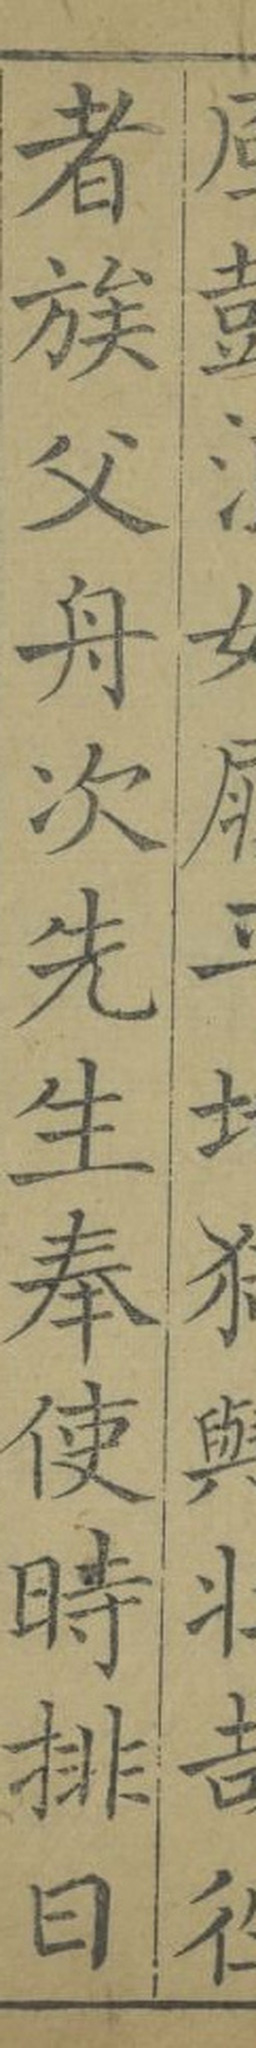者族父舟次先生奉使時排日
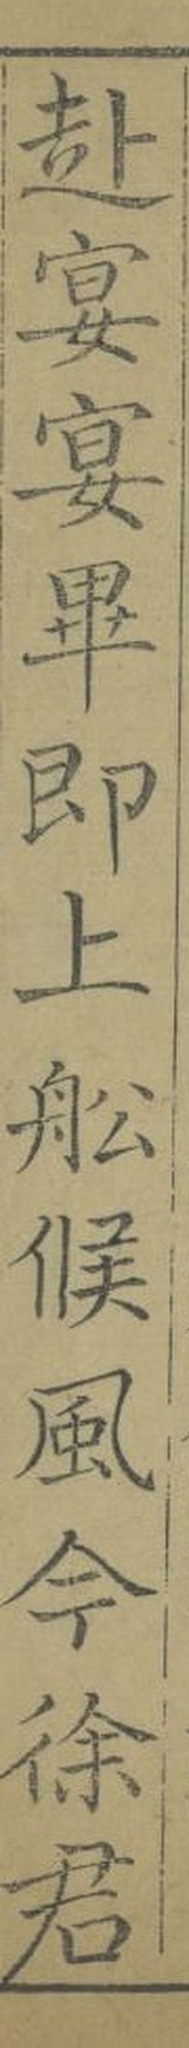赴宴宴畢即上舩候風今徐君
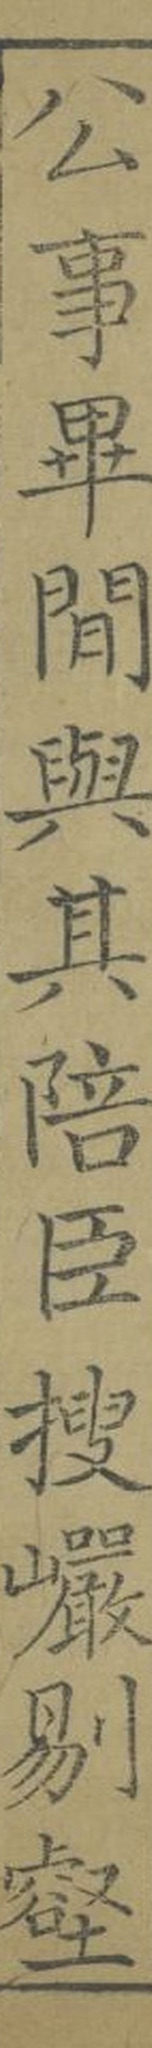公事畢閒與其陪臣搜巗剔壑
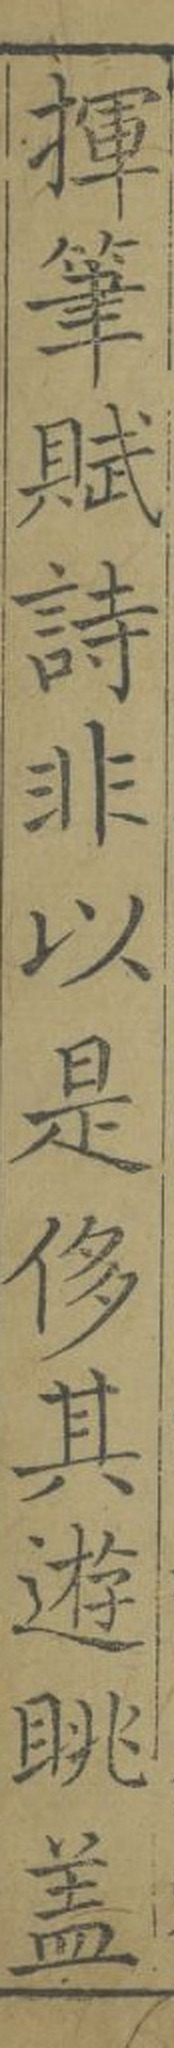揮筆賦詩非以是侈其逰眺盖

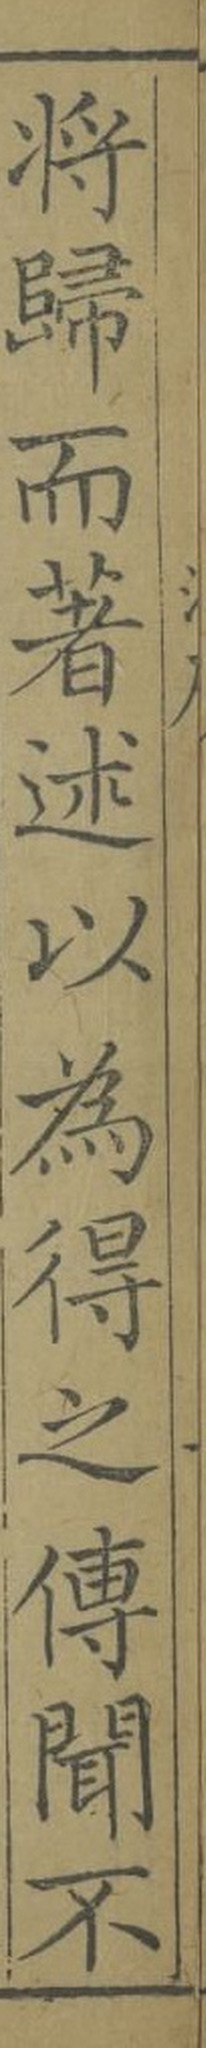将歸而著述以為得之傳聞不
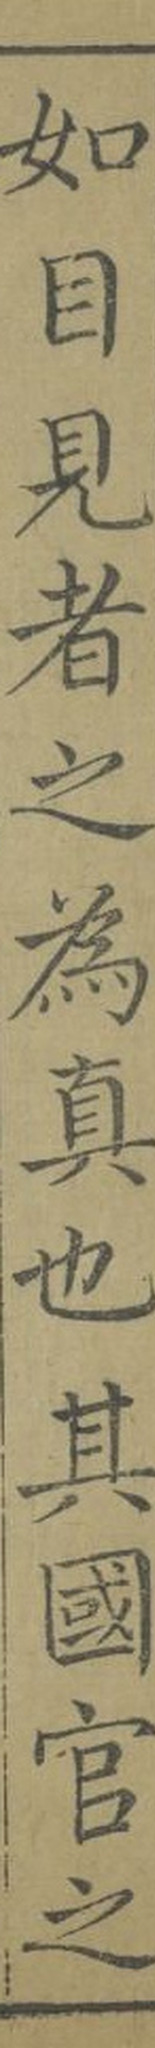如目見者之為真也其國官之
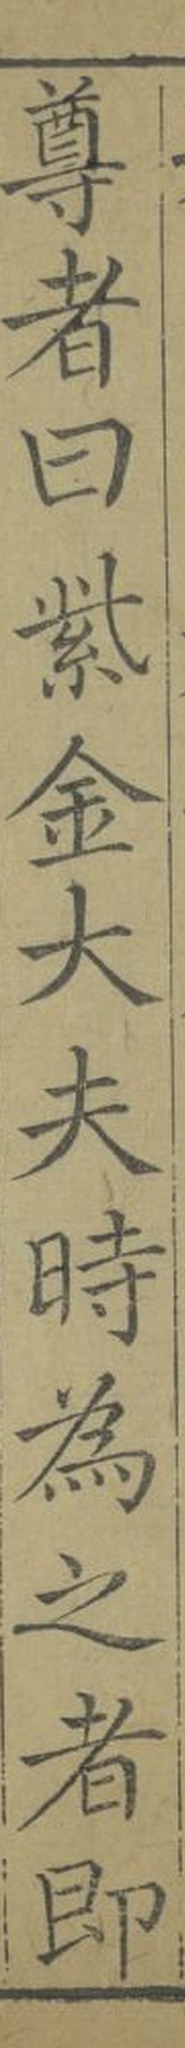尊者曰紫金大夫時為之者即
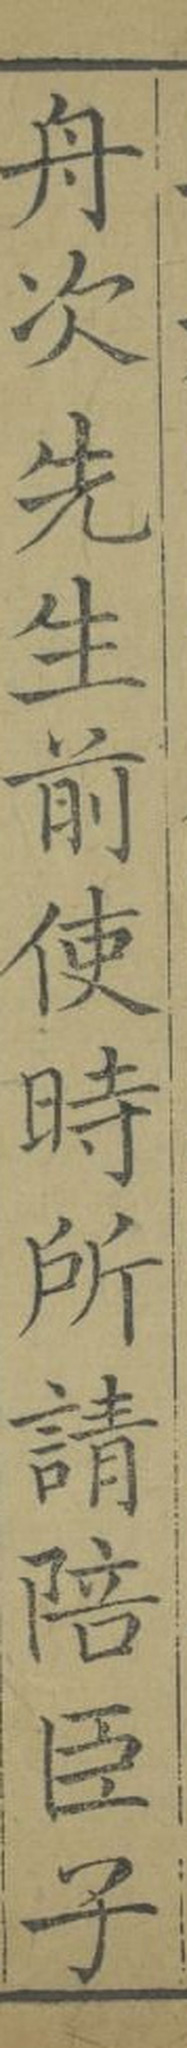舟次先生前使時所請陪臣子
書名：中山伝信録 巻一
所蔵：University of the Ryukyus Library
